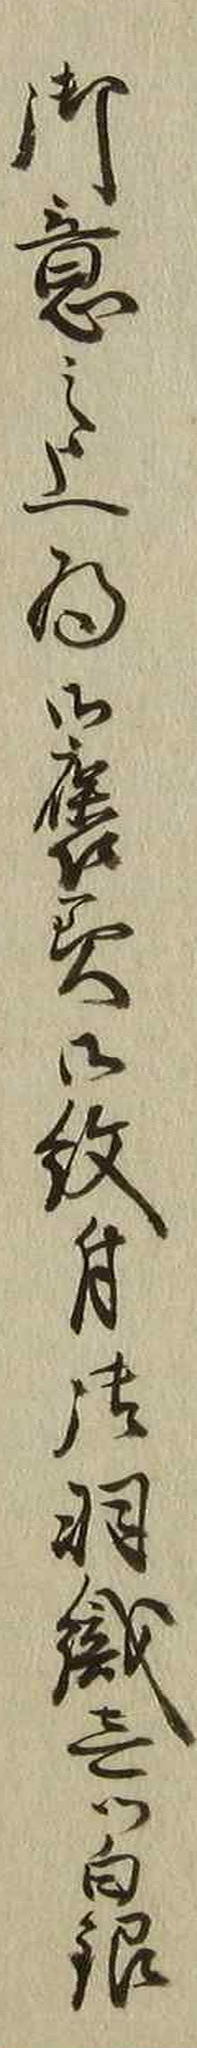御意之上為御褒美御紋付御羽織壱ツ白銀
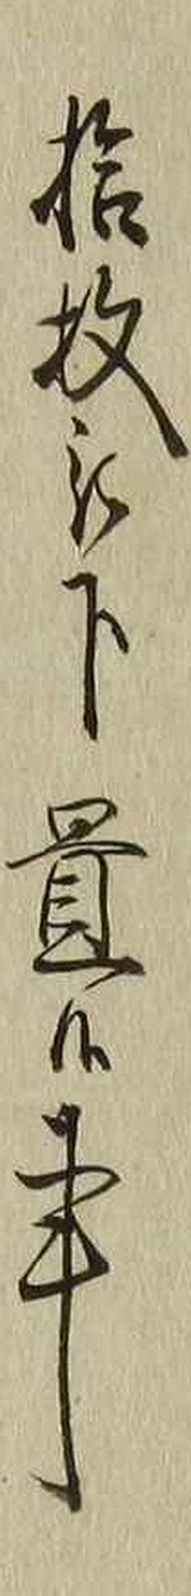拾枚被下置候事
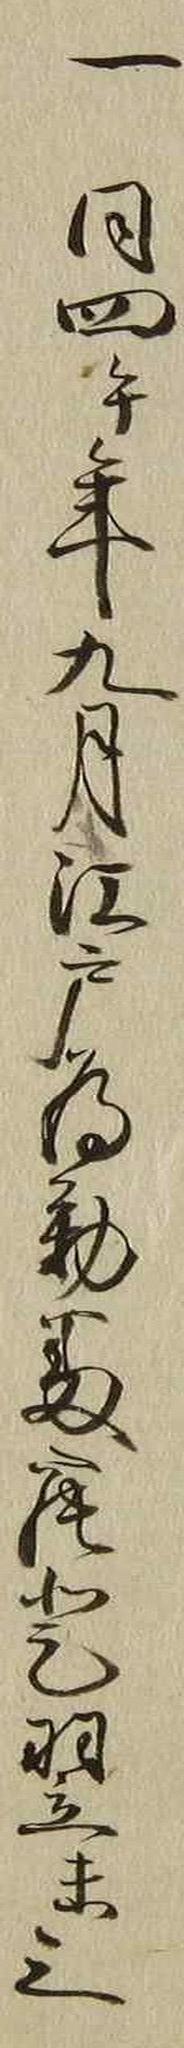一同四午年九月江戸為勤番罷登翌未三
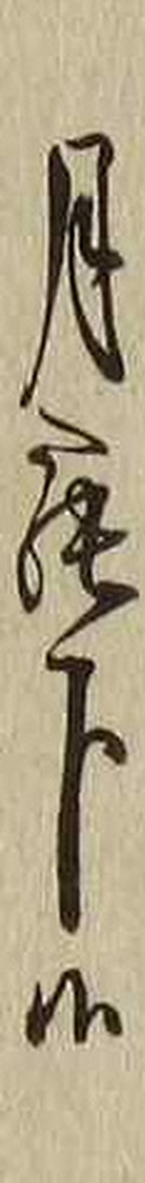月罷下候
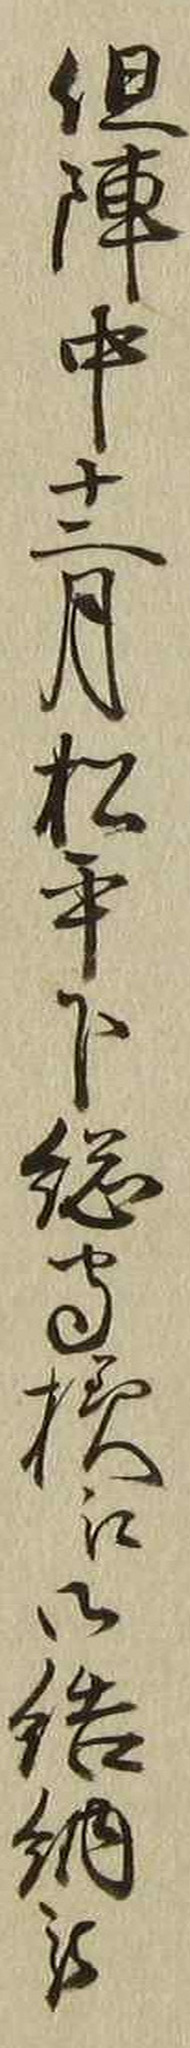但陣中十二月松平下総守様江御ゆ結納被
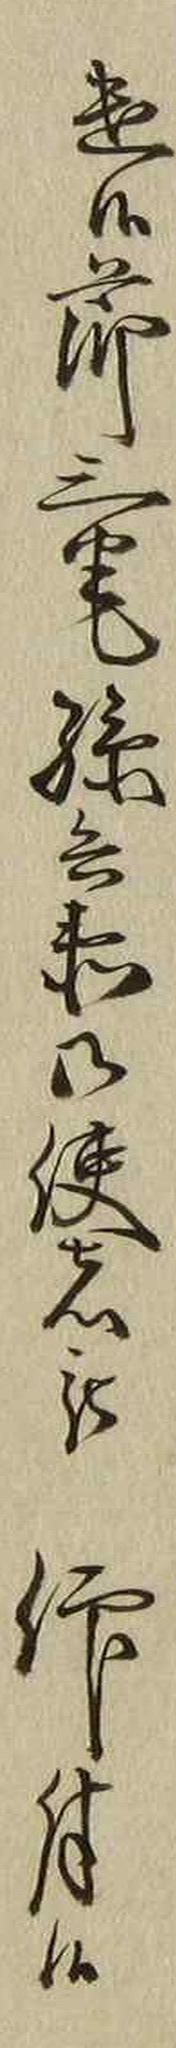遣候節三宅孫兵衛御使者被仰付候
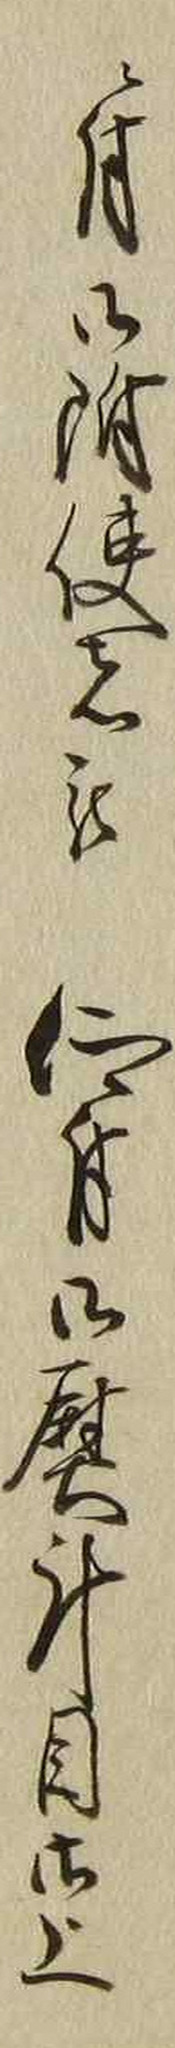ニ付御附使者被仰付御熨斗目御上
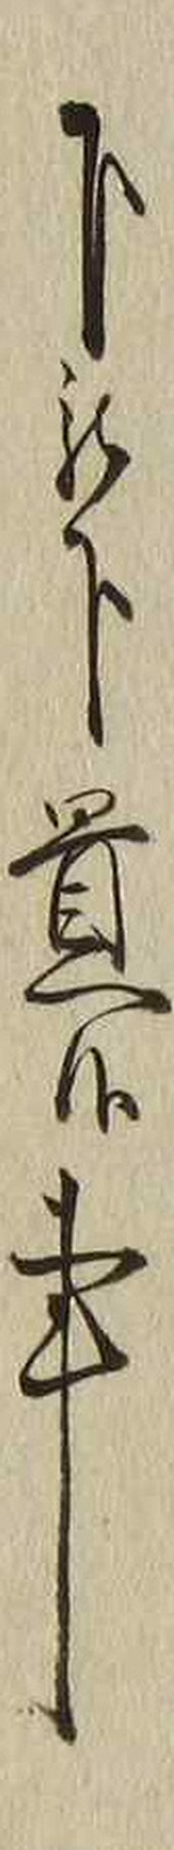下被下置候事
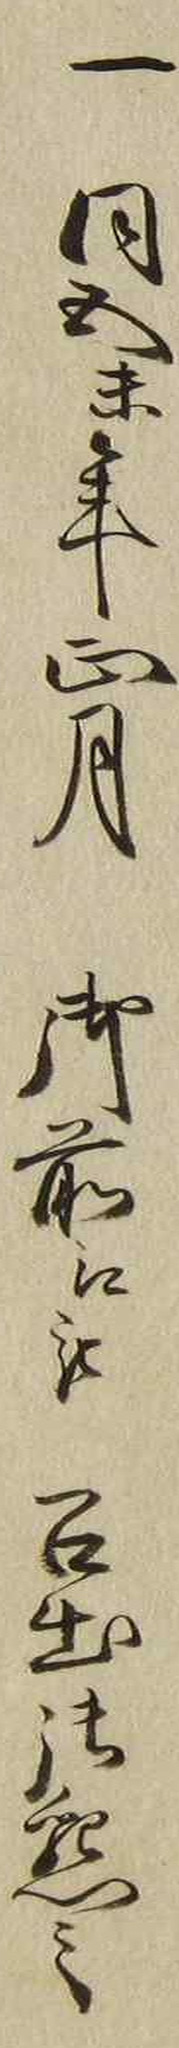一同五未年正月御前江被召出御懇之
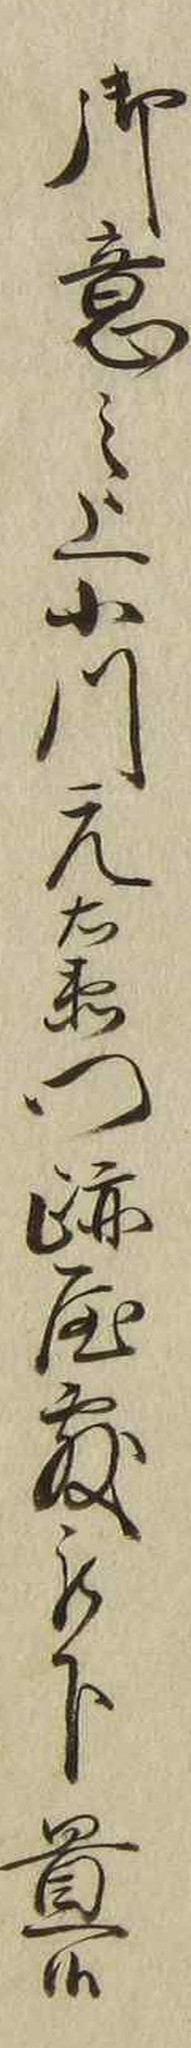御意之上小川元右衛門跡屋敷被下置候

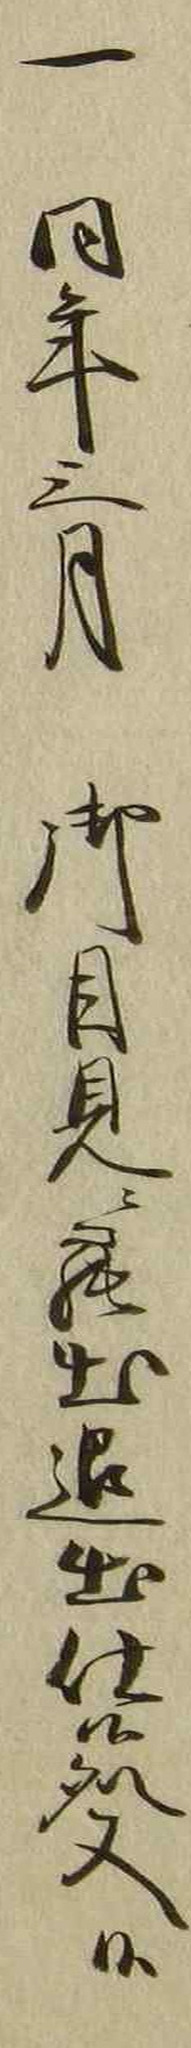一同年三月御目見ニ罷出退出仕候処又被
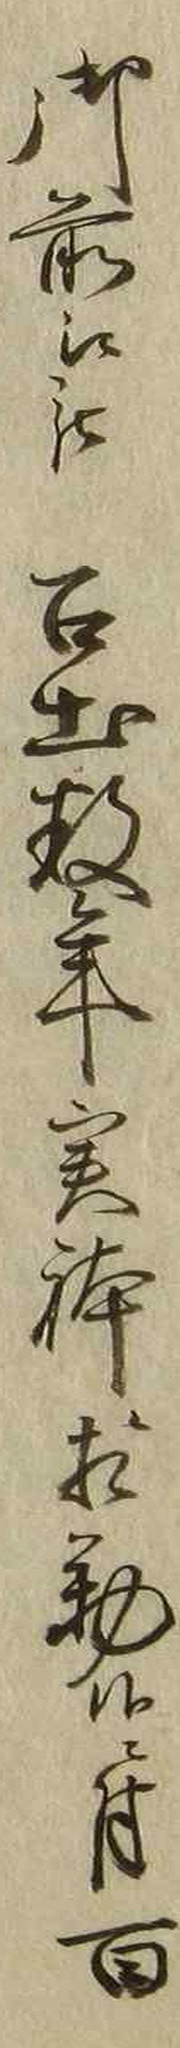御前江被召出数年実躰ニ相勤候ニ付百
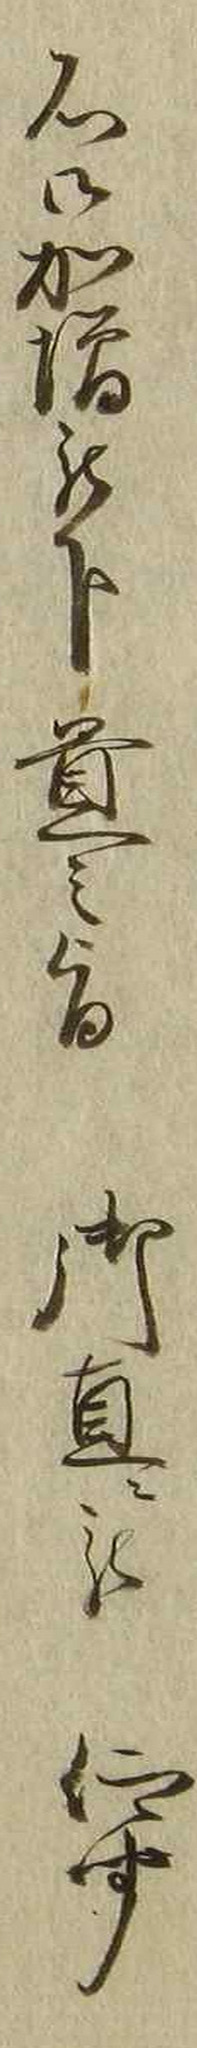石御加増被下置之旨御直ニ被仰聞
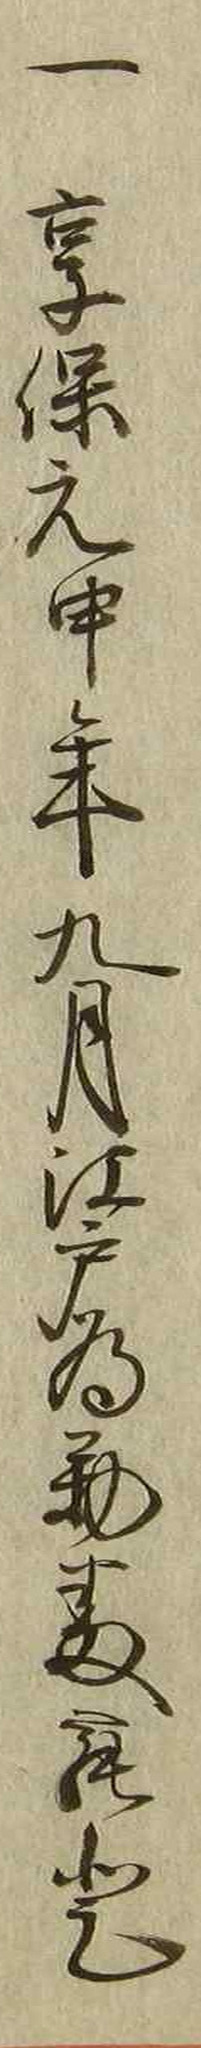一享保元申年九月江戸為勤番罷登
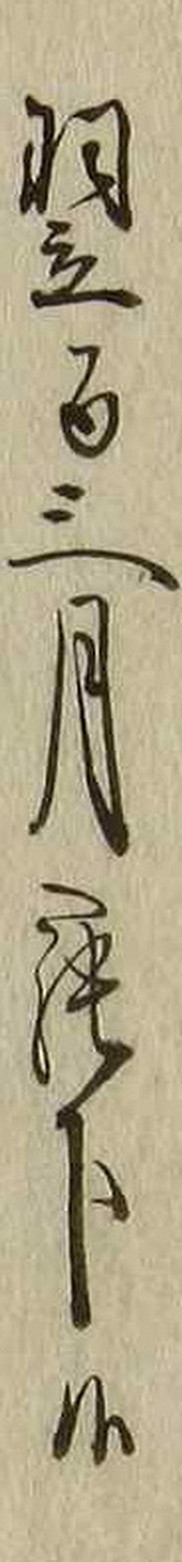翌酉三月罷下候
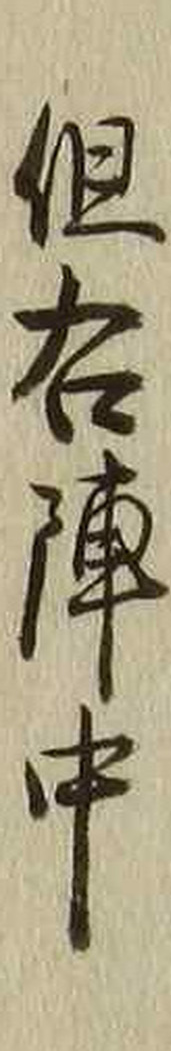但右陣中
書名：諸士系譜　巻之65　ち之部1
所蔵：会津若松市立会津図書館
